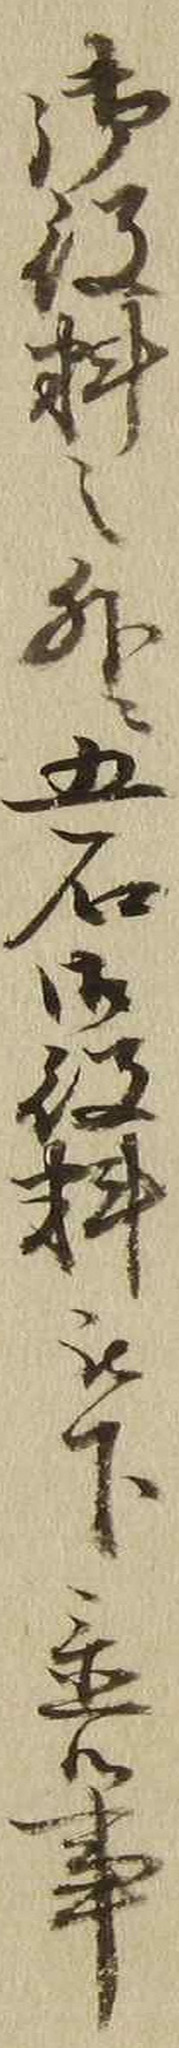御役料之外ニ五石御役料被下置候事
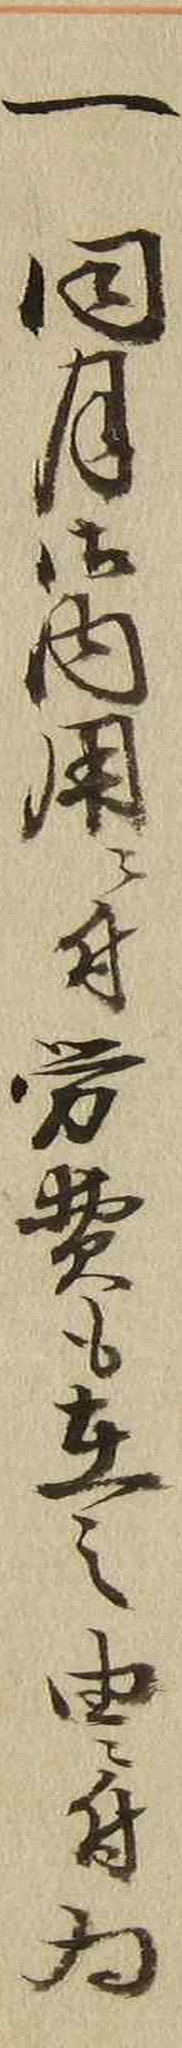一同月御内用ニ付労費も在之由ニ付為
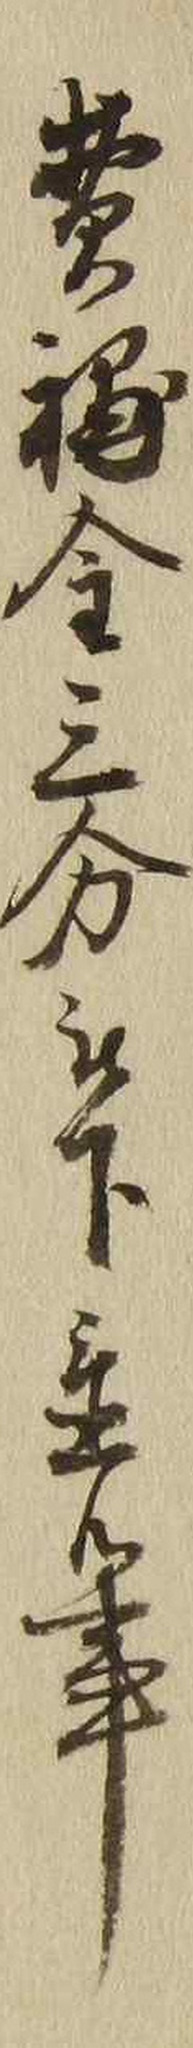費補金三分被下置候事
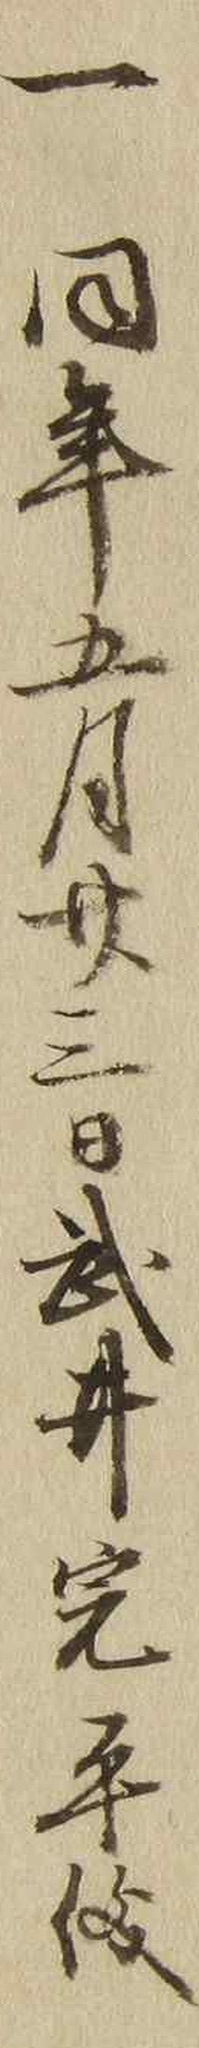一同年五月廿三日武井完平儀

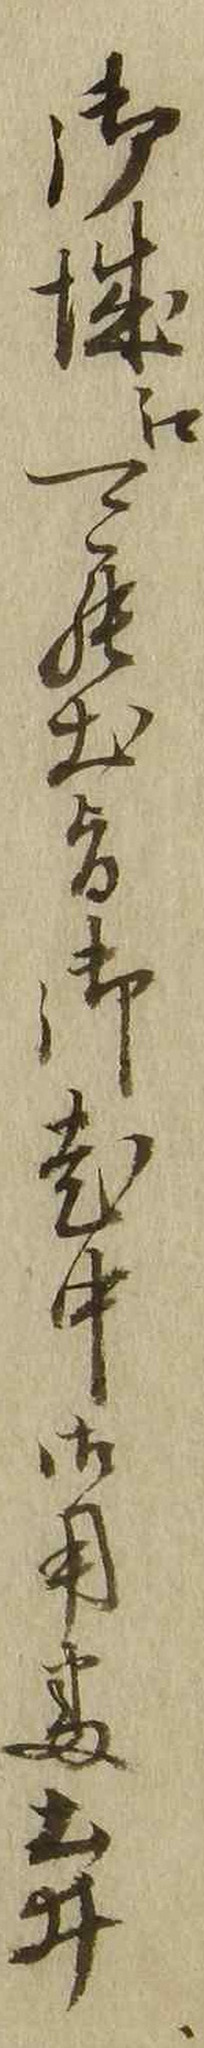御城江可罷出旨御老中御用番土井
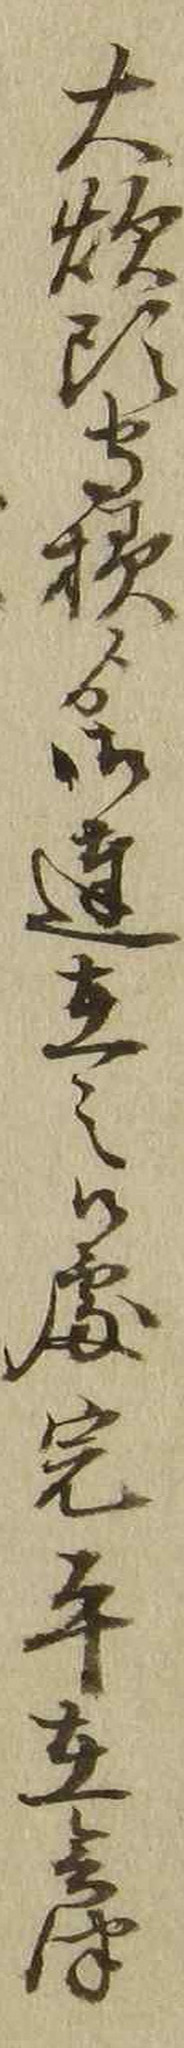大炊頭守様ゟ御達在之候處完平在兵津
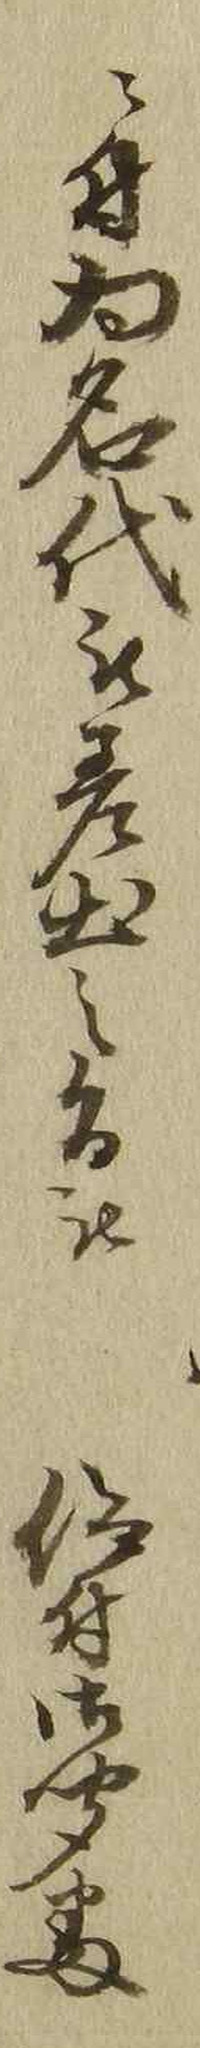ニ付為名代被差出之旨被仰付御聞番
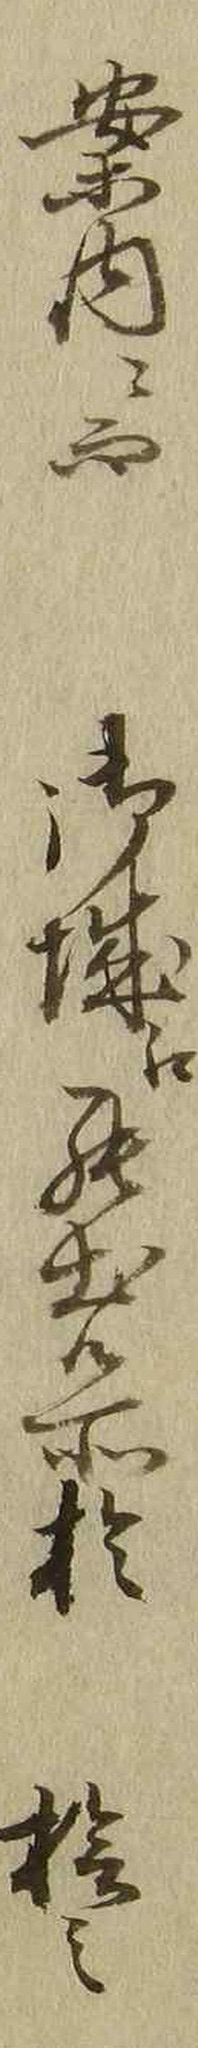案内ニ而御城江罷り出候所於撫之
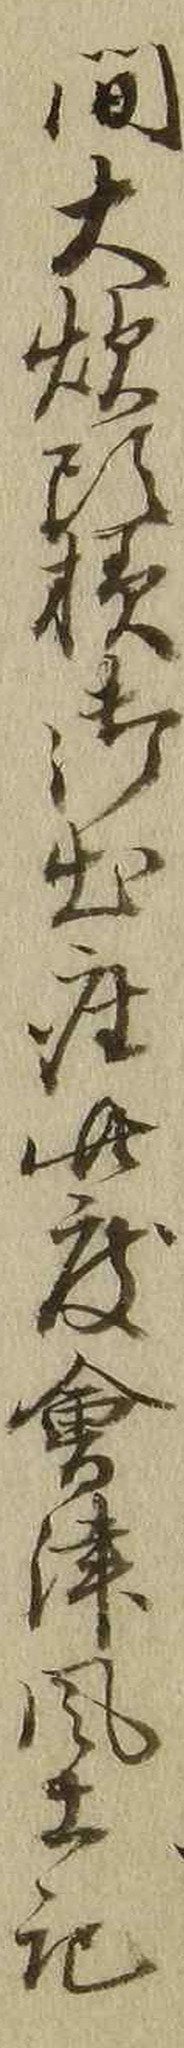間大炊頭様御出座此度会津風土記
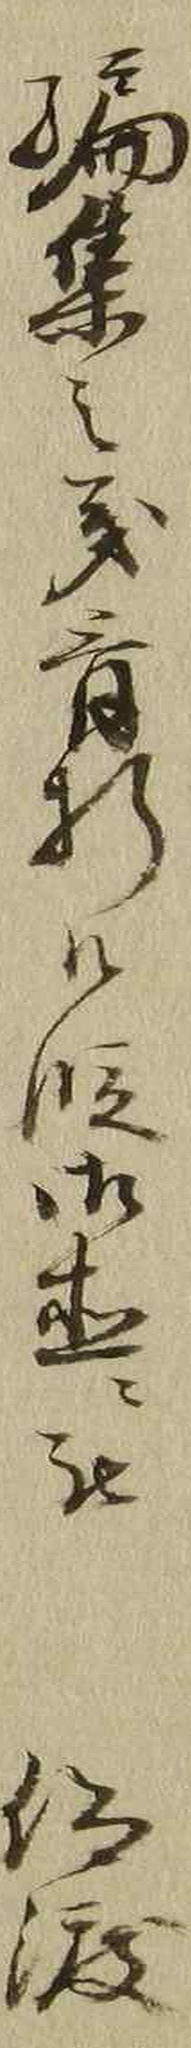編集之義骨折候段御直々被仰渡
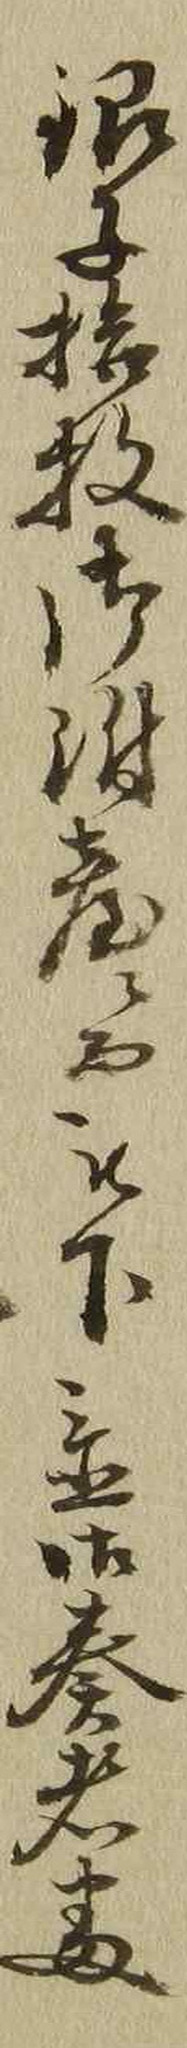銀子拾枚御附臺ニ而被下置御奏者番
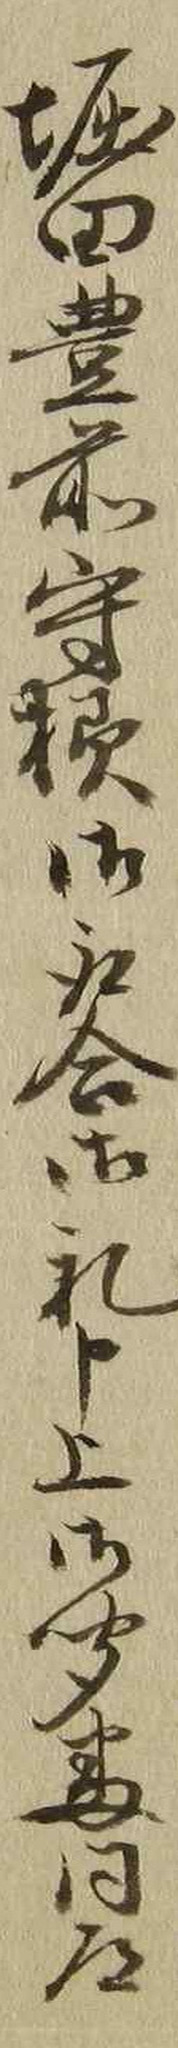堀田豊前守様御取合御礼申上御聞番同道
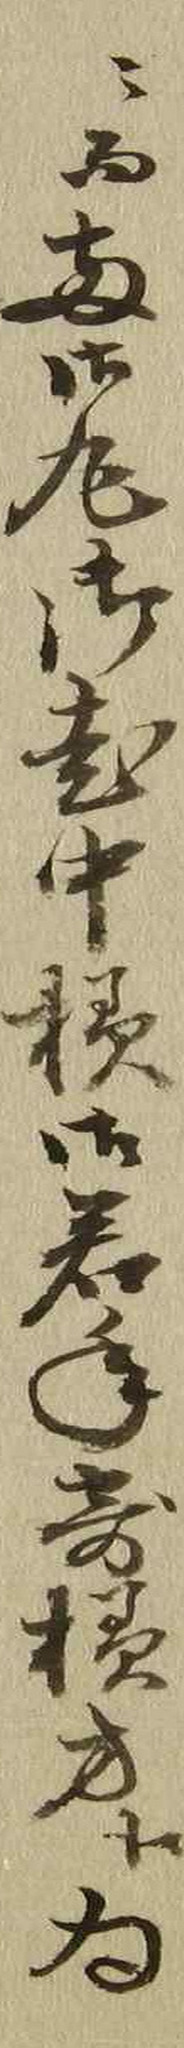ニ而両御丸御老中様御若年寄様方江為
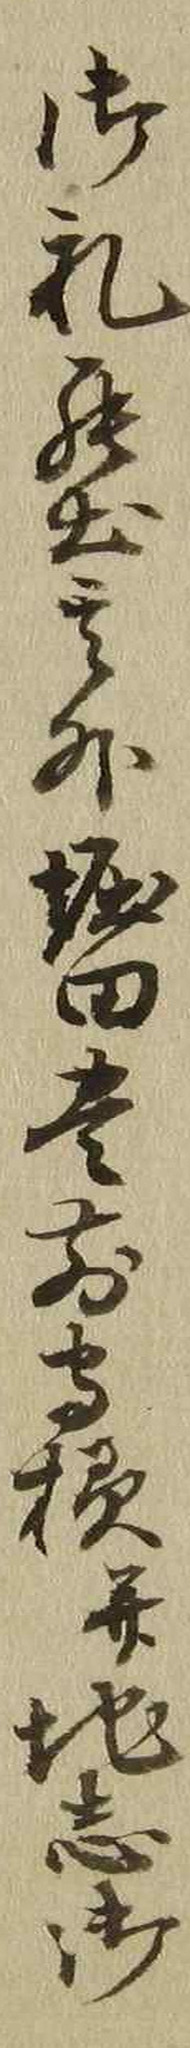御礼罷出其外堀田豊前守様幷地志御
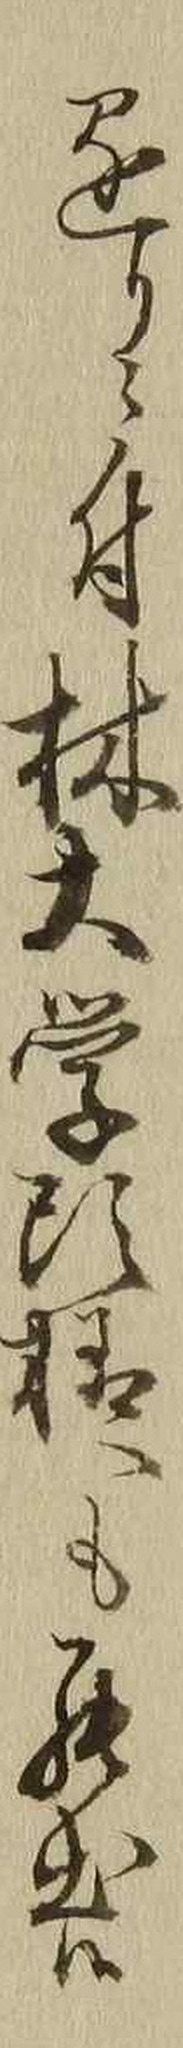懸りニ付林大学頭様へも罷出候
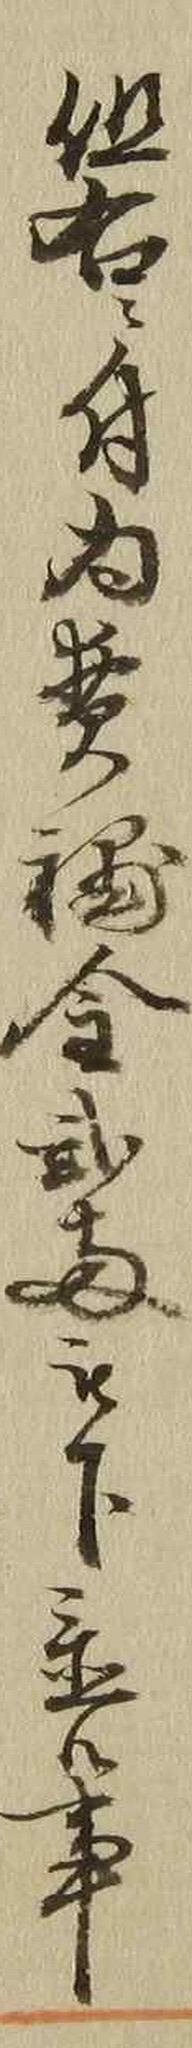但右ニ付為費補金弐両被下置候事
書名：諸士系譜　巻之64　と之部7
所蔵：会津若松市立会津図書館
